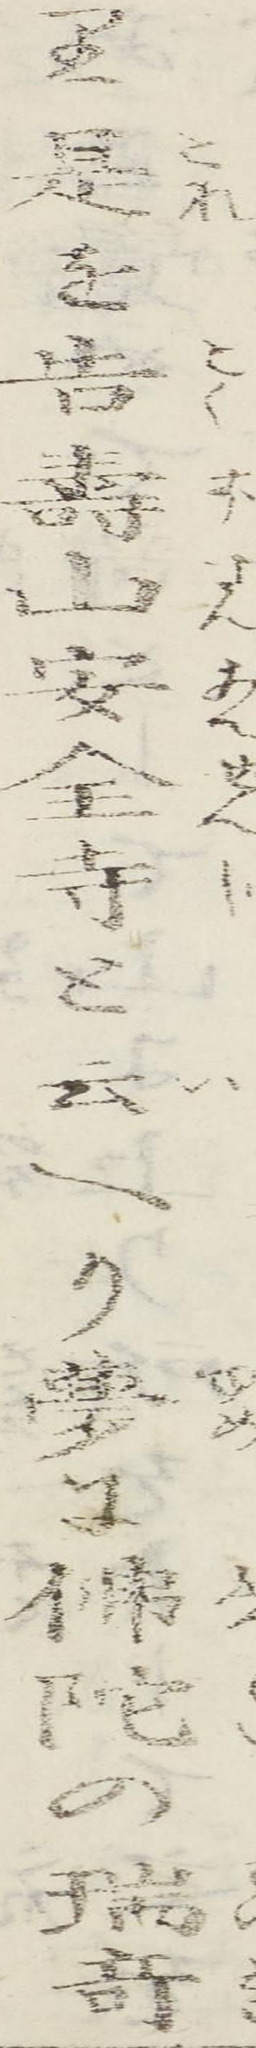り是を告寿山安全寺と云へり夢に仏陀の瑞奇

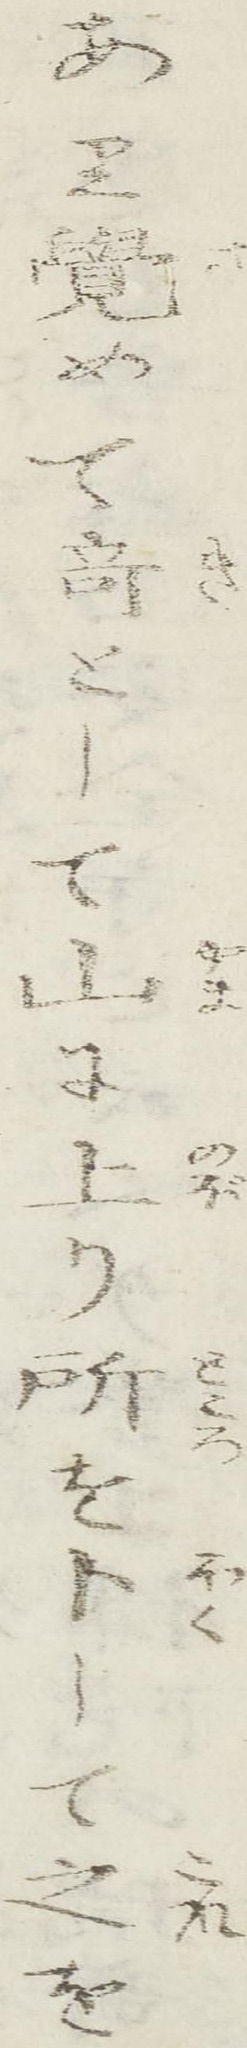あり覚めて奇として山に上り所を卜して之を
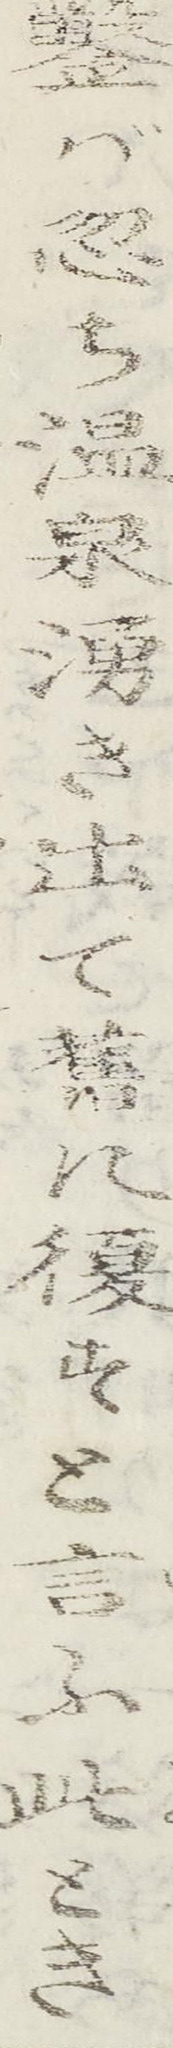鑿は忽ち温泉湧き出て旧に復すと言ふ此とき
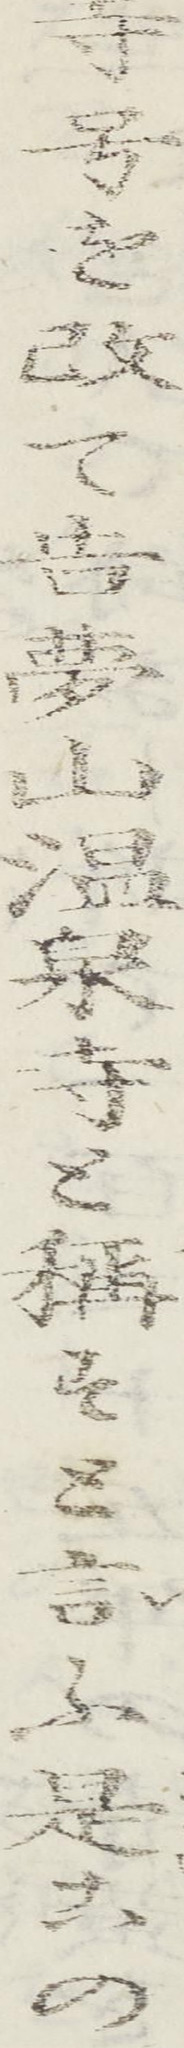寺号を改て告夢山温泉寺と称すと言ふ是この
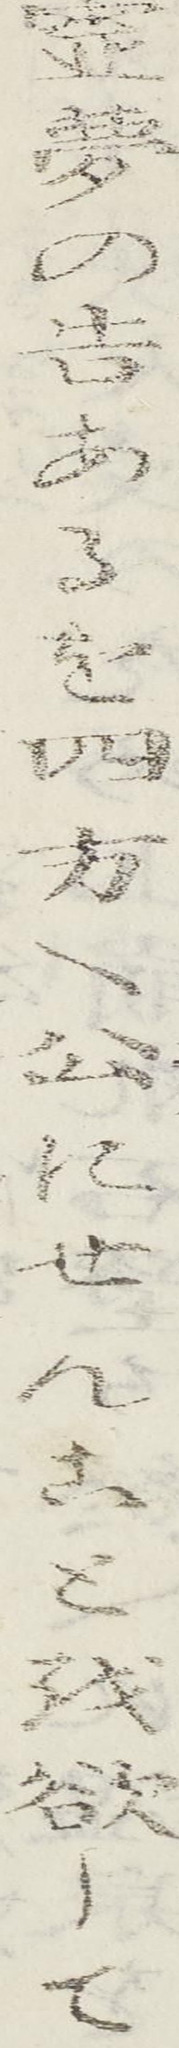霊夢の告あるを四方へ公にせんことを欲して
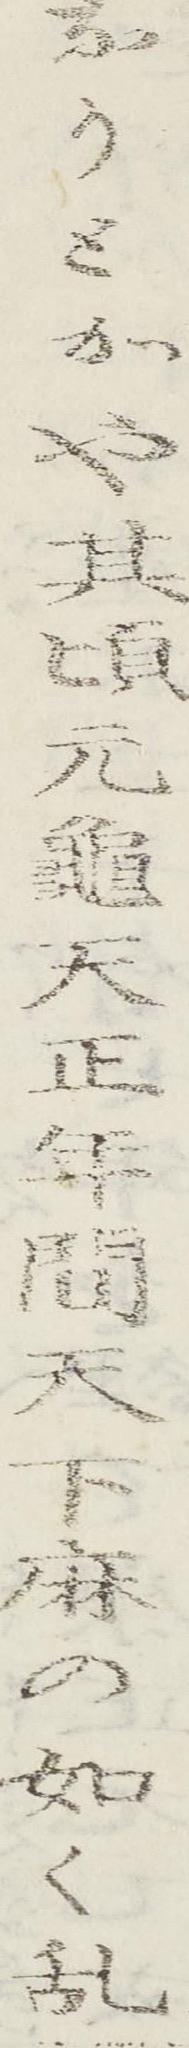なうとかや其頃元亀天正年間天下麻の如く乱
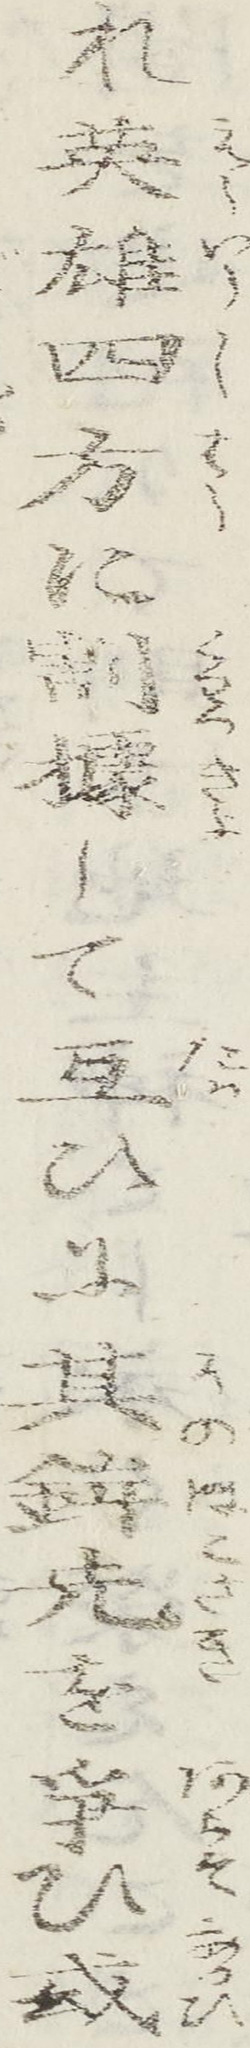れ英雄四方に割拠して互ひに其鉾先を争ひ或
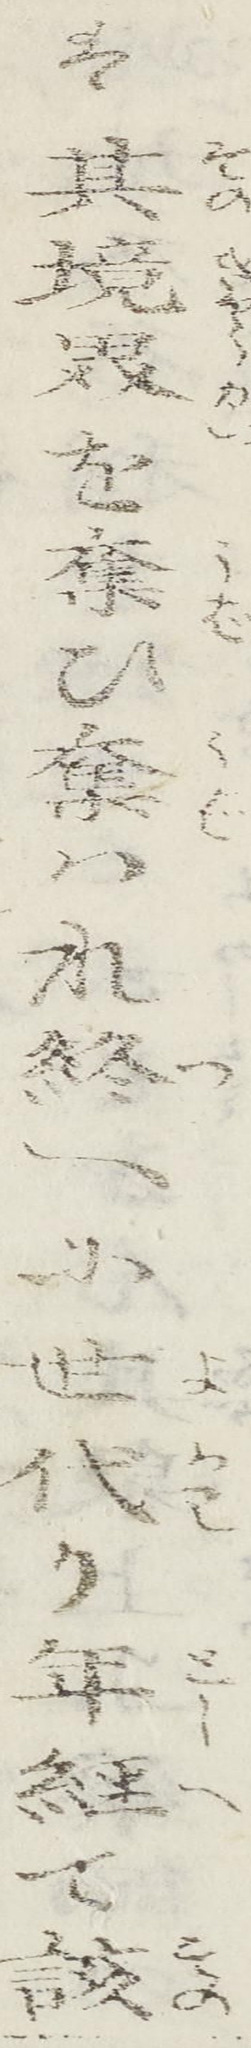は其境界を奪ひ奪はれ終いに世代り年経て該
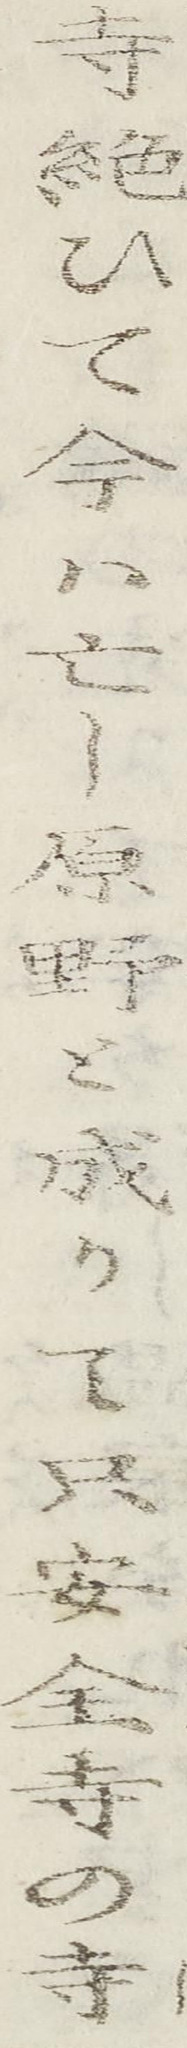寺絶ひて今は亡し原野と成りて只安全寺の寺
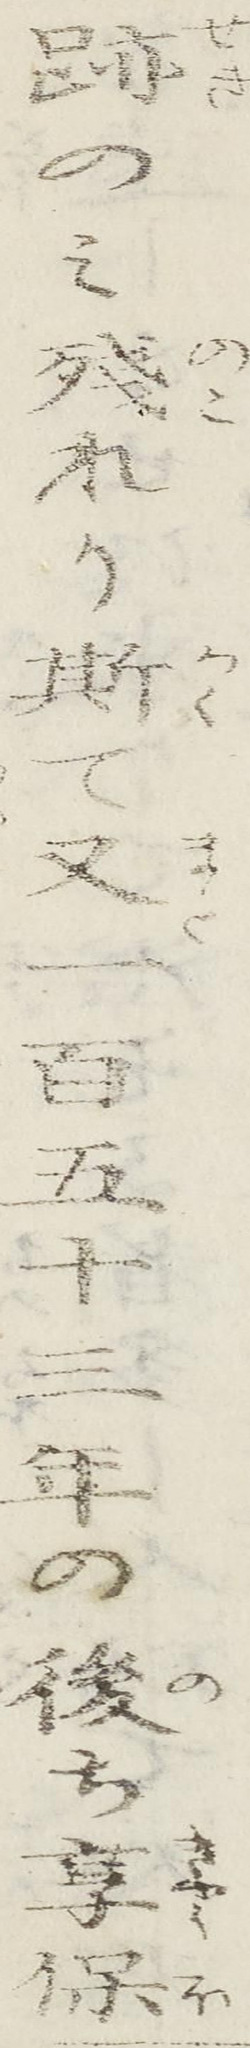跡のみ残れり斯て又一百五十三年の後ち享保
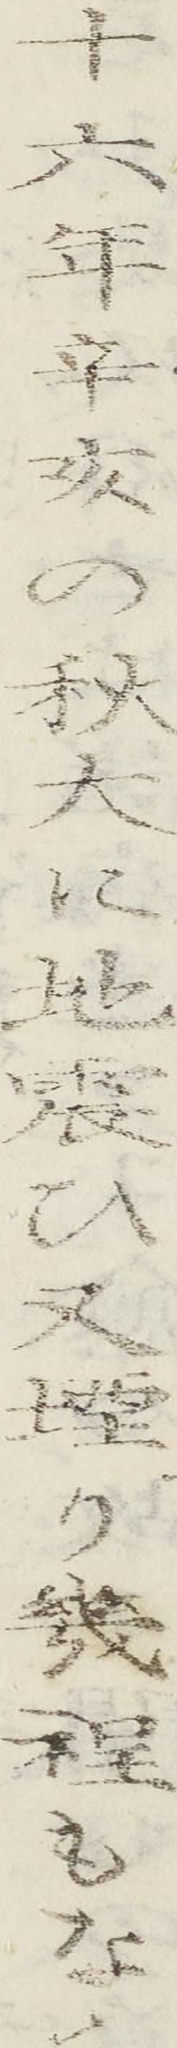十六年辛亥の秋大に地震ひ又堙り幾程もなく
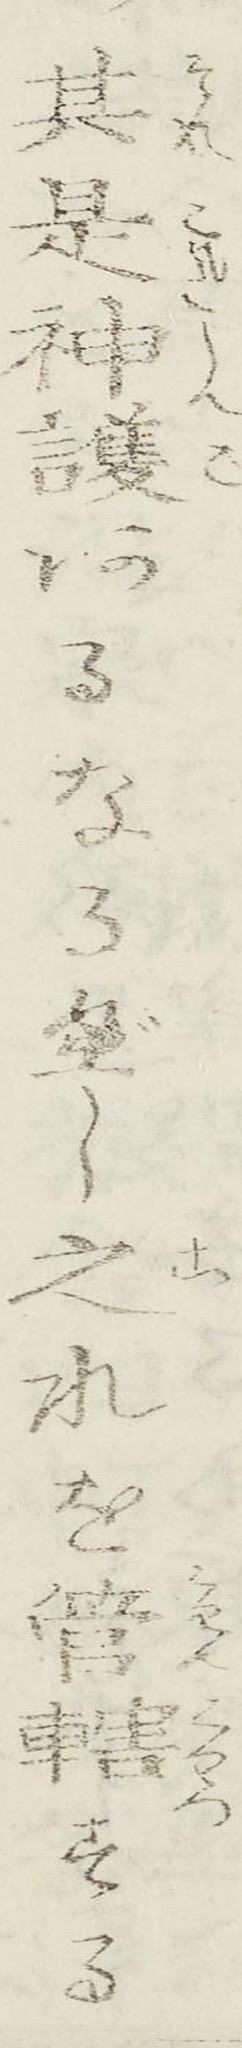き出つ其是神護あるなるべし之れを管轄する
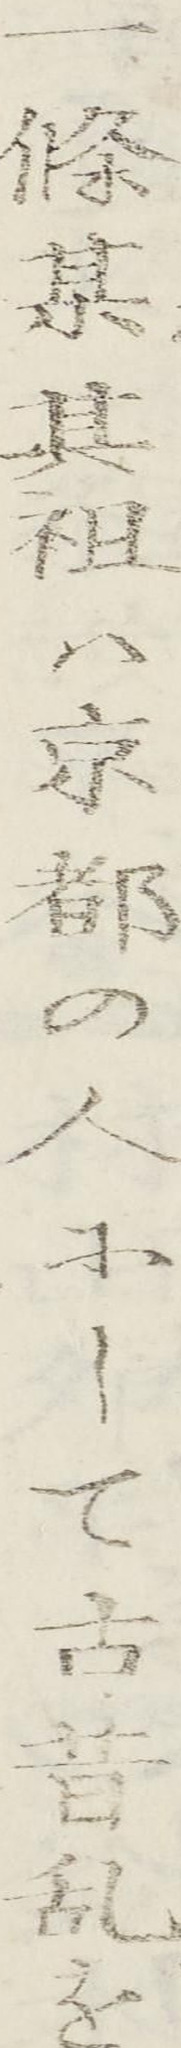者は一条某其祖は京都の人にして古昔乱を避
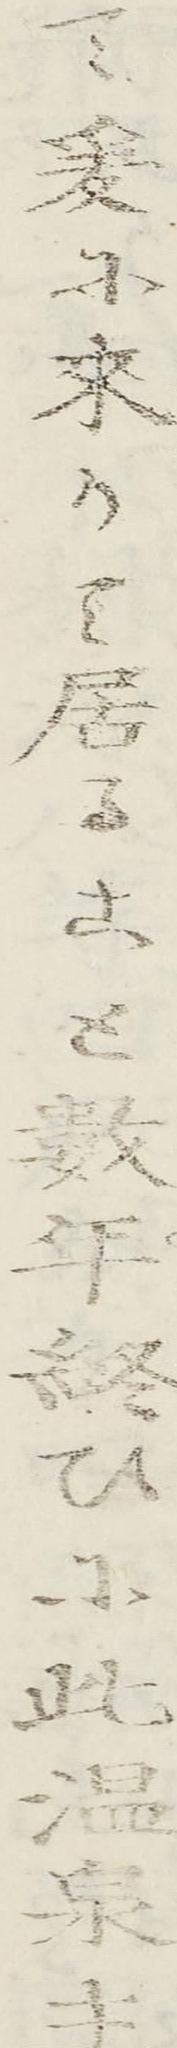けて爰に来りて居ること数年終ひに此温泉主
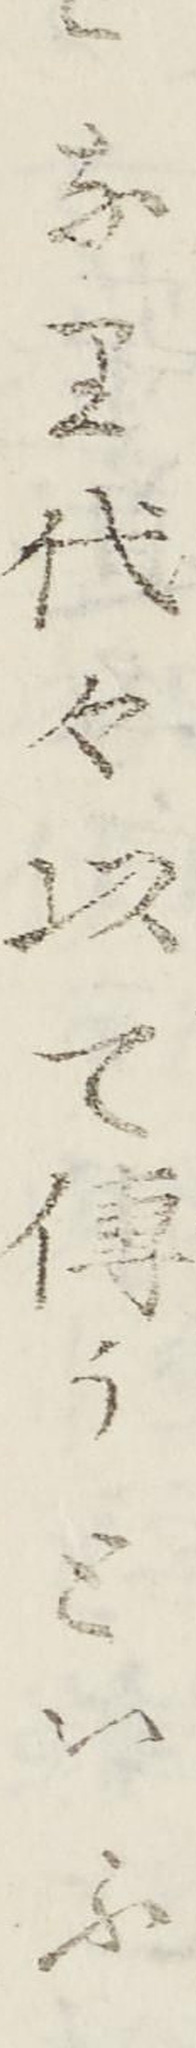となり代々以て伝うといふ
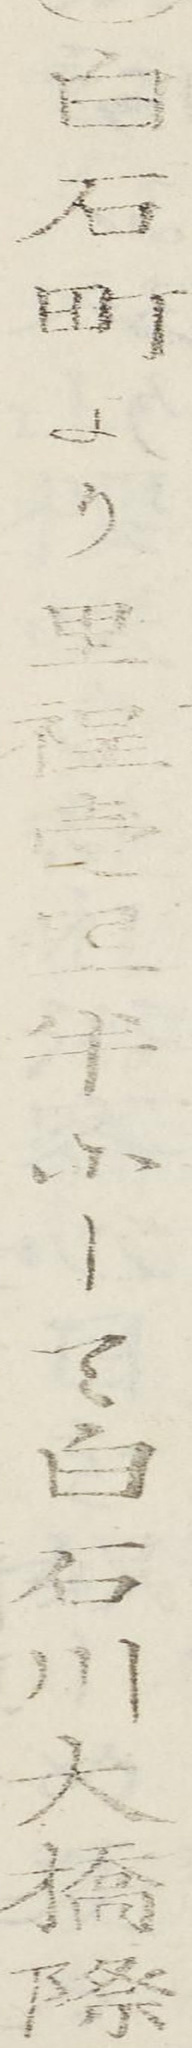〇白石町より里程壱里半にして白石川大橋際
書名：鎌先温泉由來記
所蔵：東京大学地震研究所図書室 Earthquake Research Institute Library, The University of Tokyo, JAPAN
